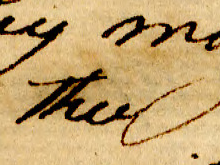thee
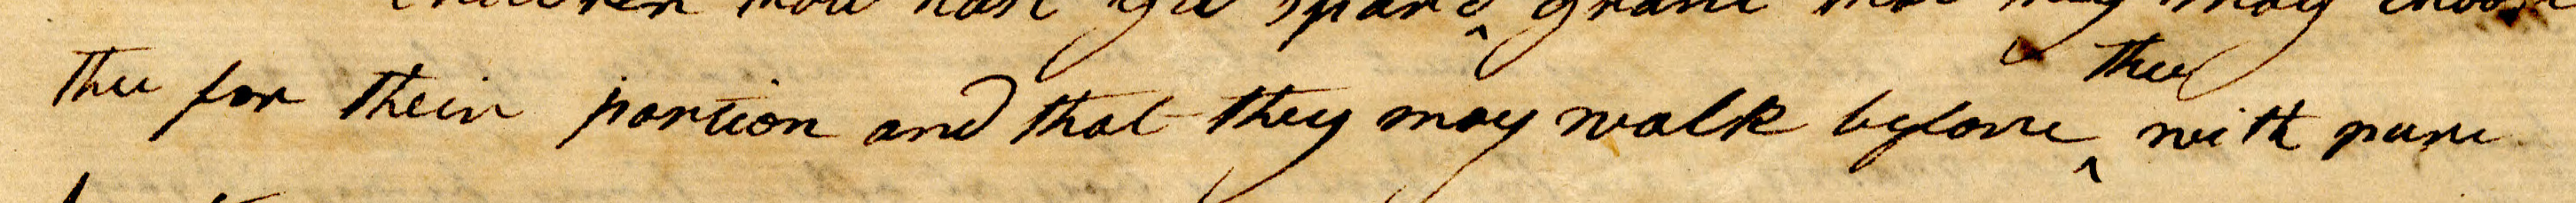thee for their portion and that they may walk before ^ with pure
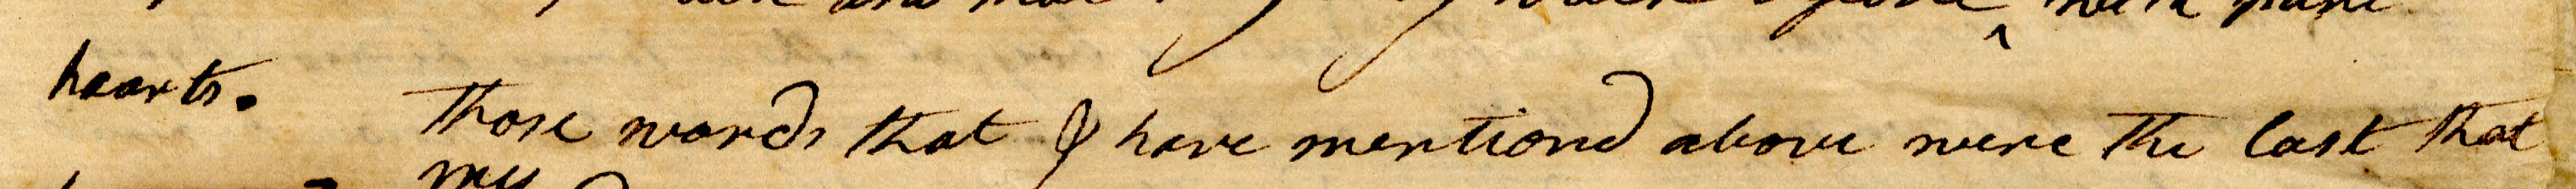hearts. Those words that I have mentiond above were the last that
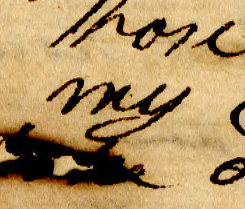my
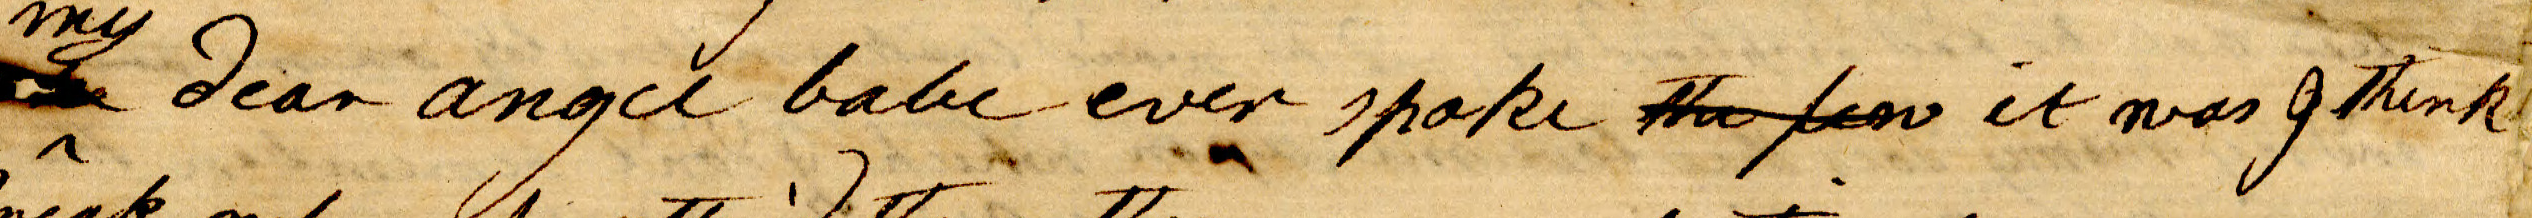^ dear angel babe ever spoke [the fear] it was I think
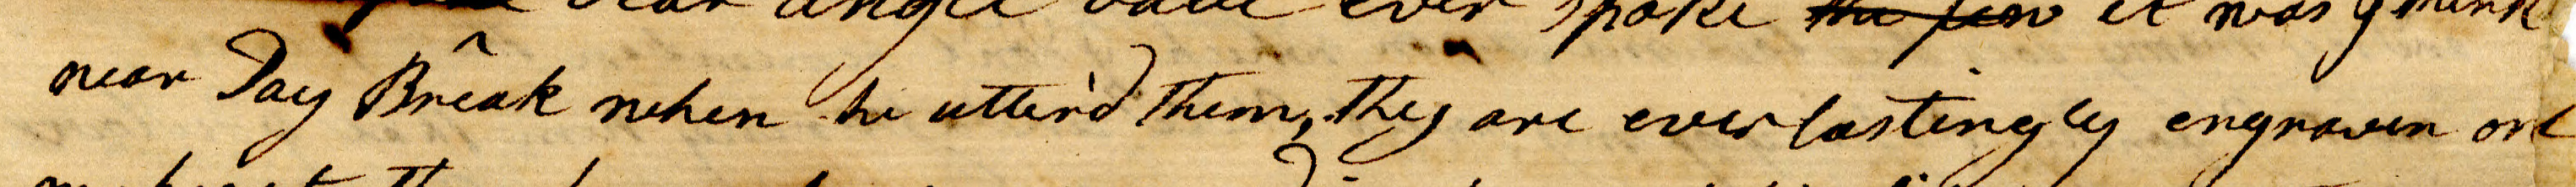near Day Break when he utter'd them, they are everlastingly engraven on
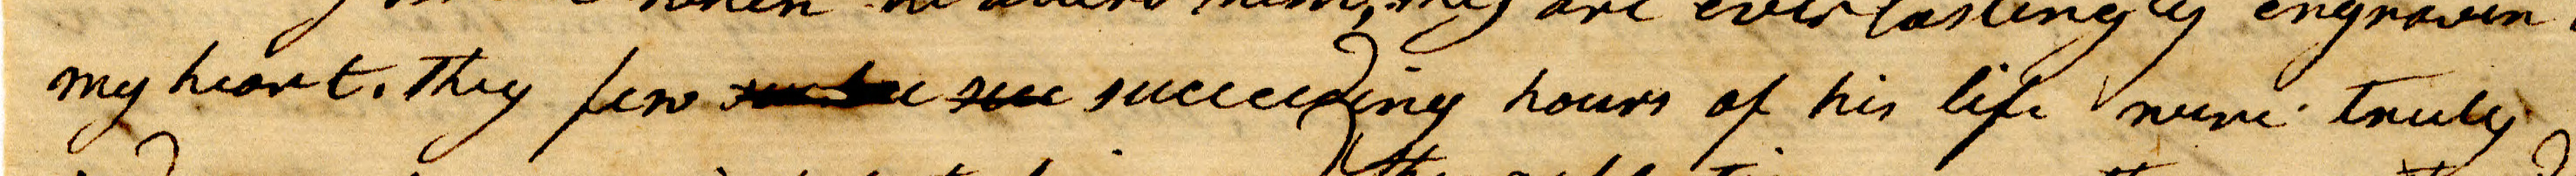my heart. thy few [_______] succeeding hours of his life were truly
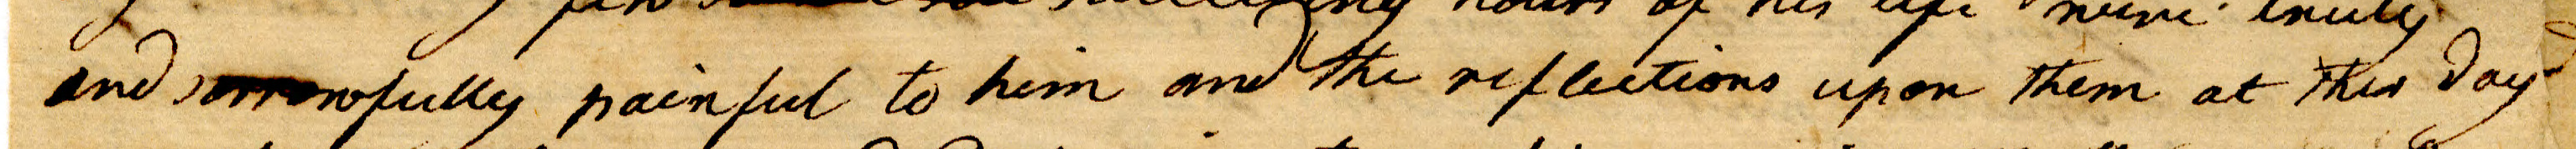and sorrowfully painful to him and the reflections upon them at this day
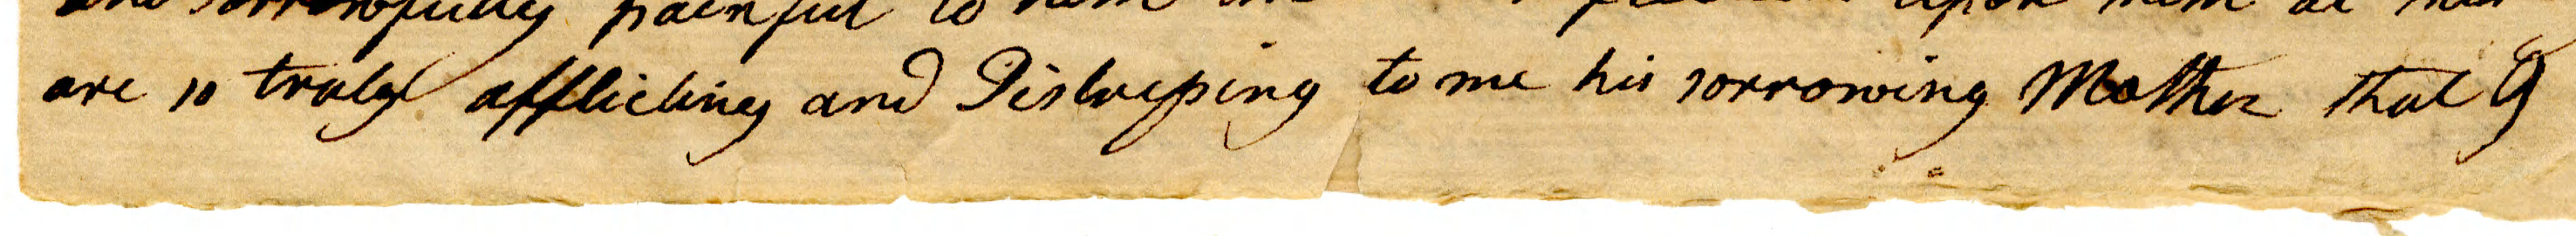are so truly afflicting and Distressing to me his sorrowing Mother that I
